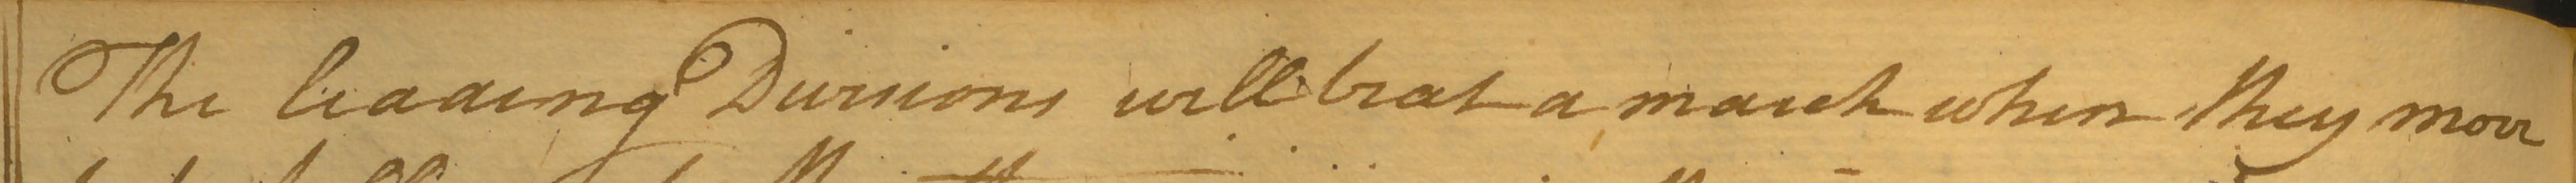The leading Divisions will beat a march when they move
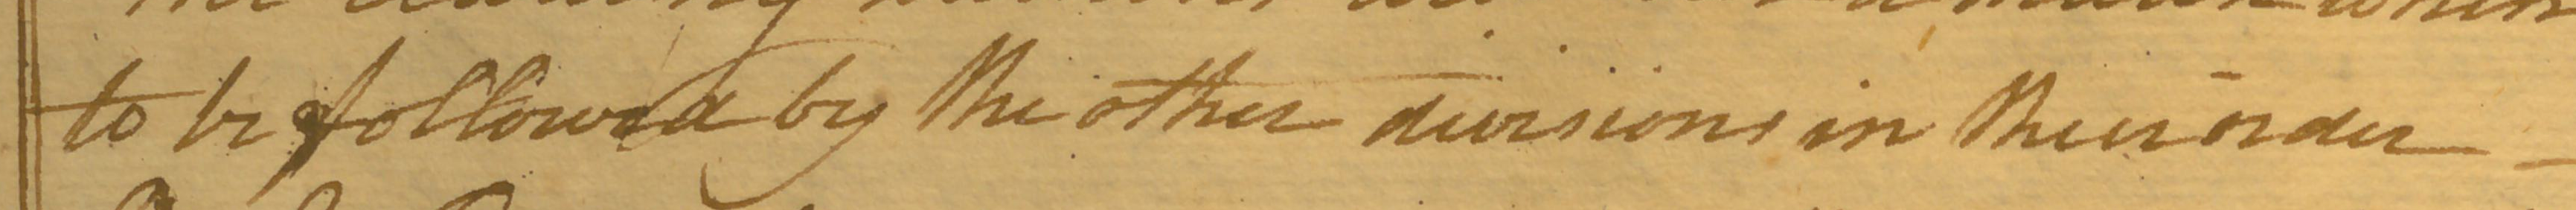to be followed by the other divisions in their order-
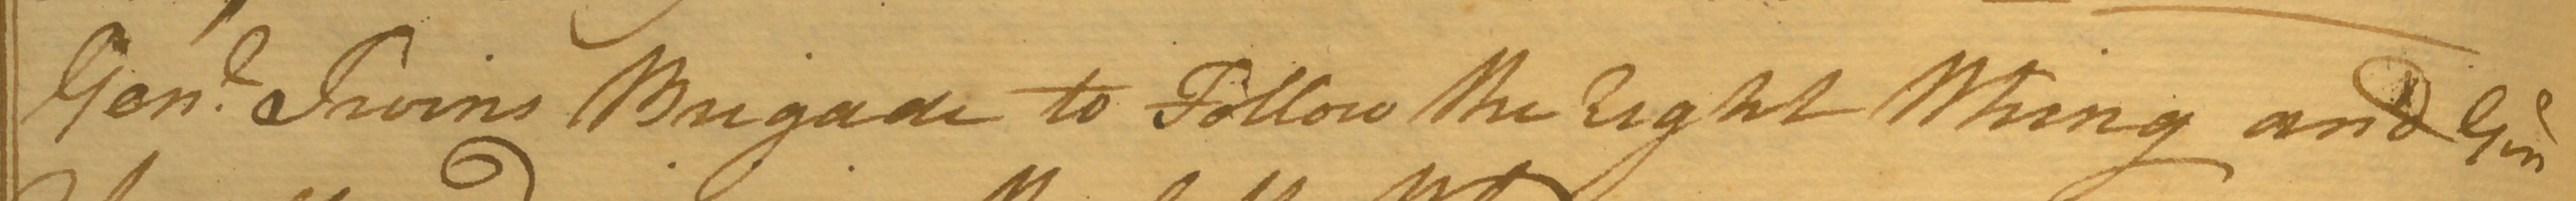Gen^l. Irwins Brigade to Follow the right Whing and Gen^l
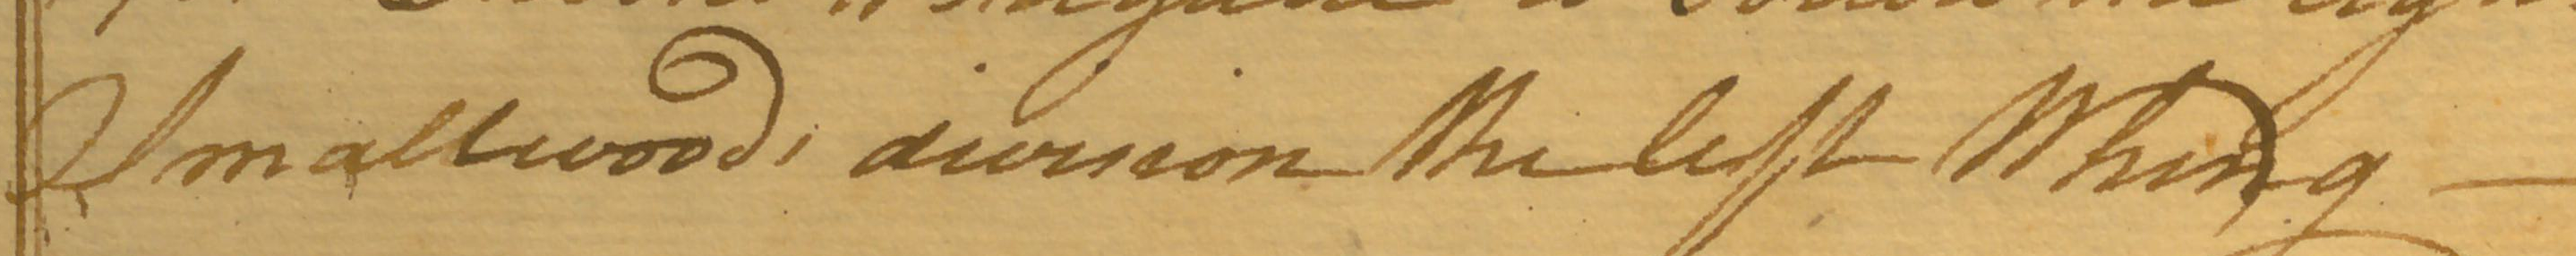Smallwoods division the left Whing-
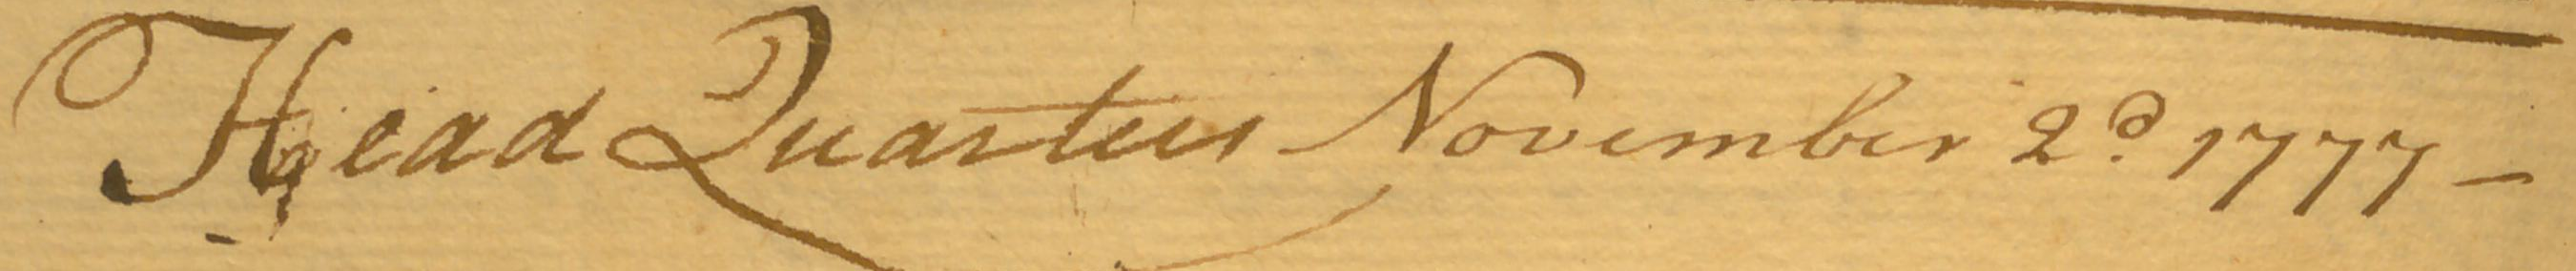Head Quarters November 2^d. 1777-
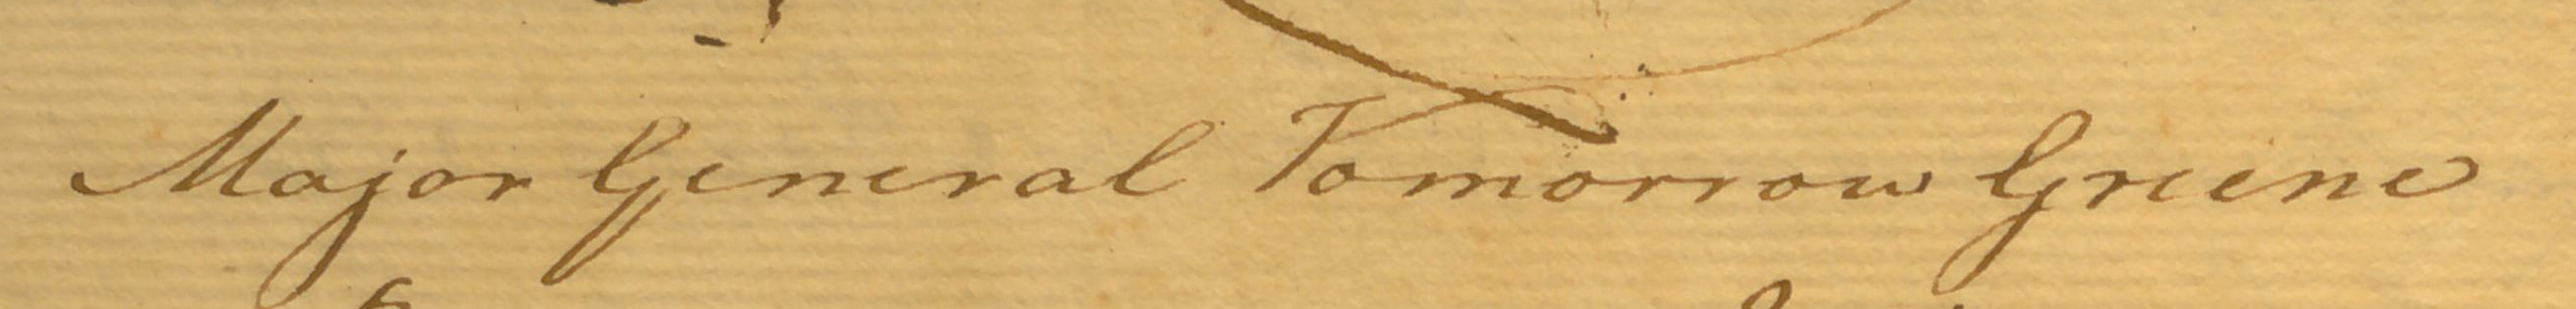Major General Tomorrow Greene
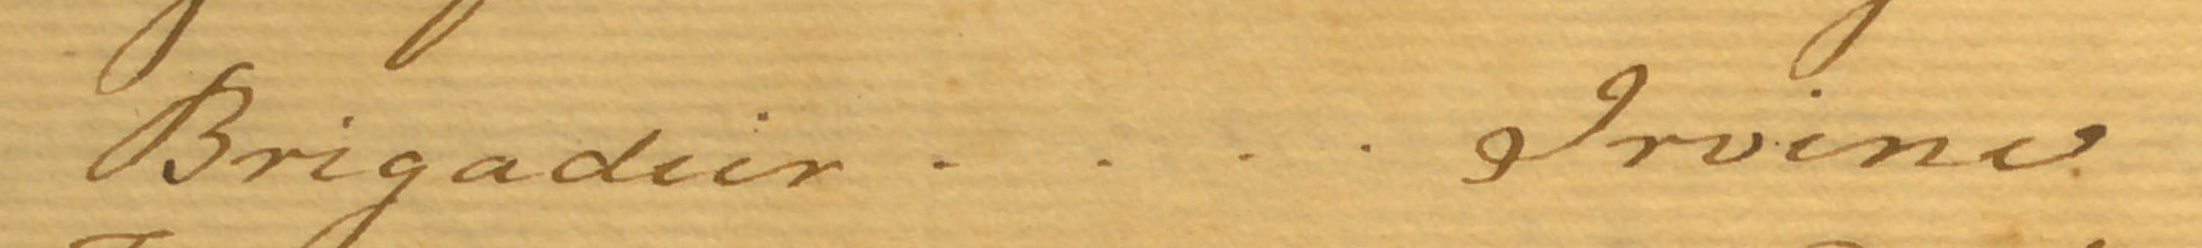Brigadier .... Irvine
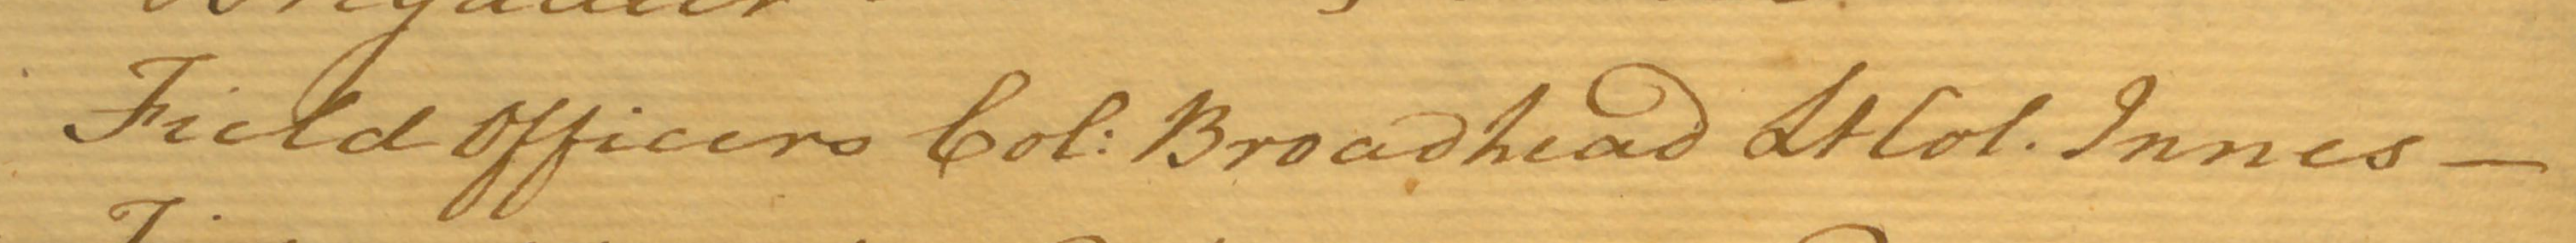Field Officers Col: Broadhead Lt Col. Innes-
